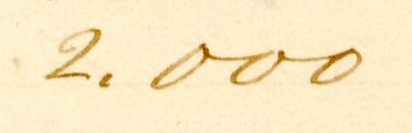2,000
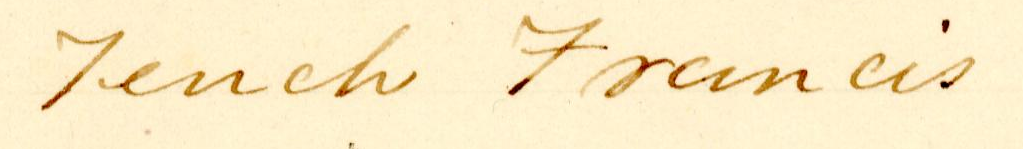Tench Francis
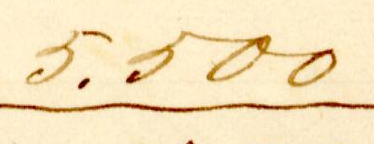5,500
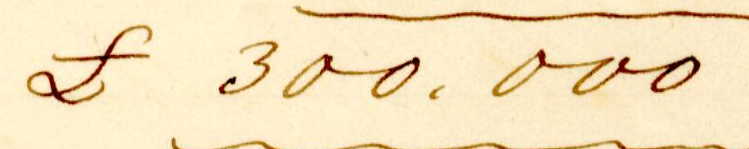£ 300,000
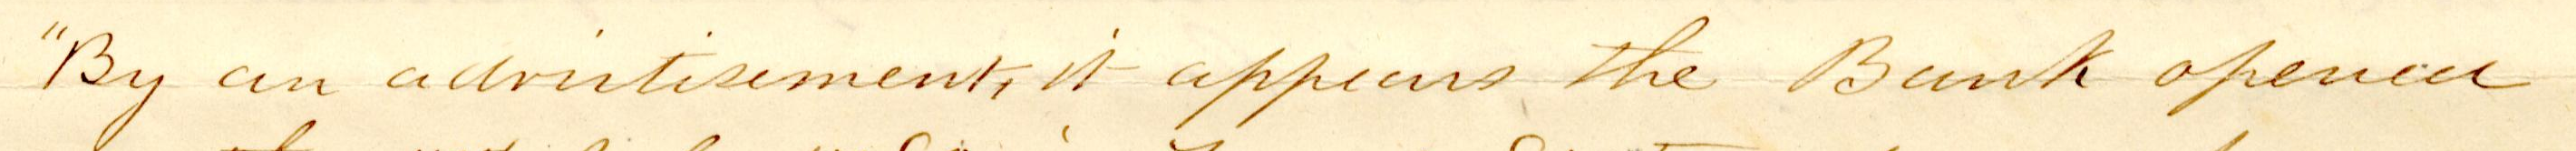By an advertisement, it appears the Bank opened
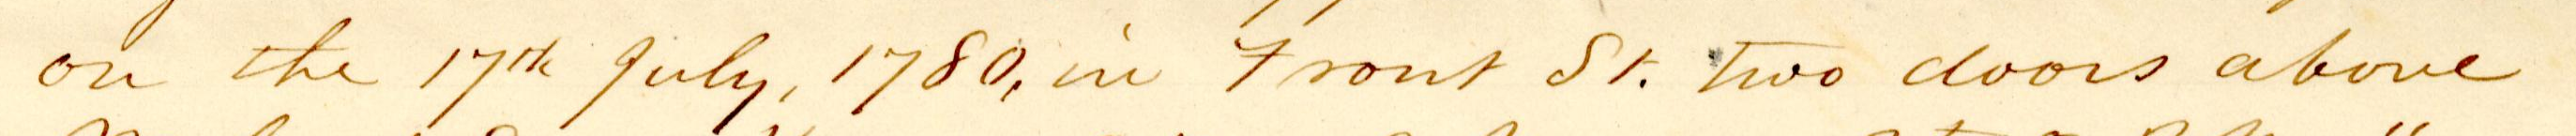on the 17th July, 1780, in Front St. Two doors above
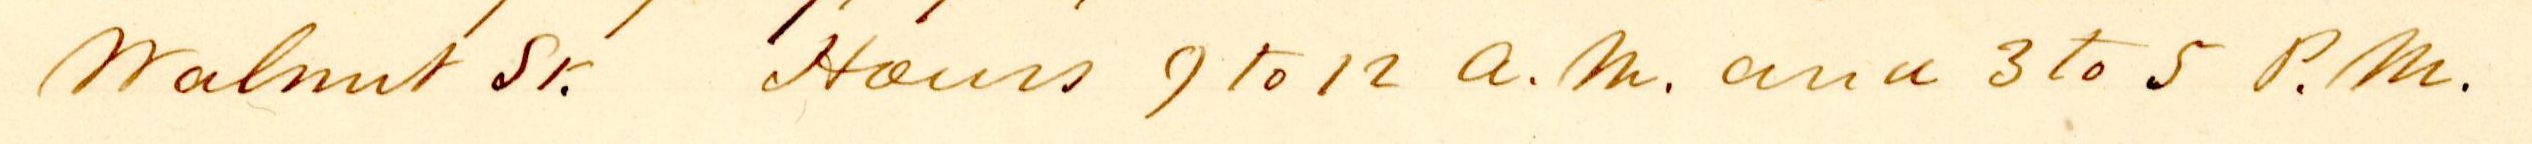Walnut St. Hours 9 to 12 A. M. and 3 to 5 P. M.
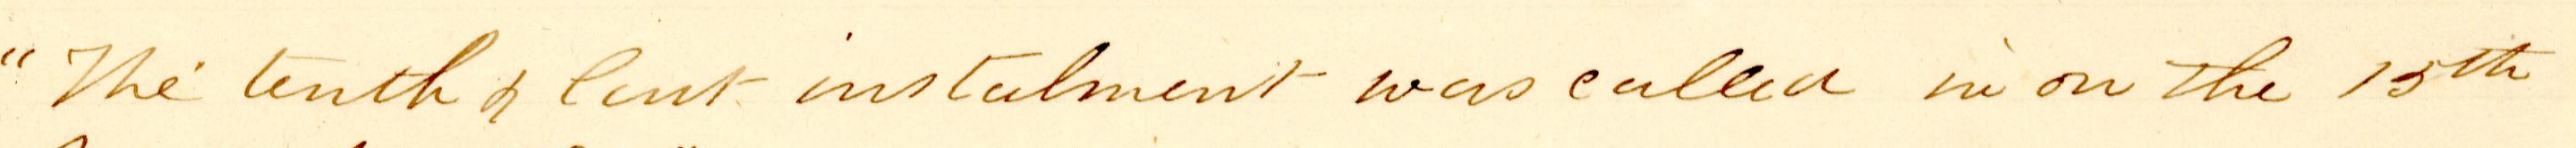"The tenth & last instalment was called in on the 10th
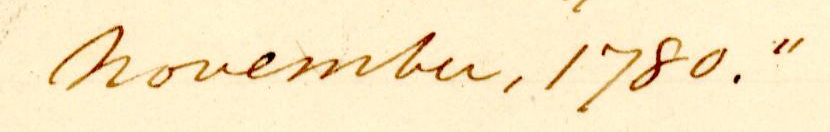November, 1780."
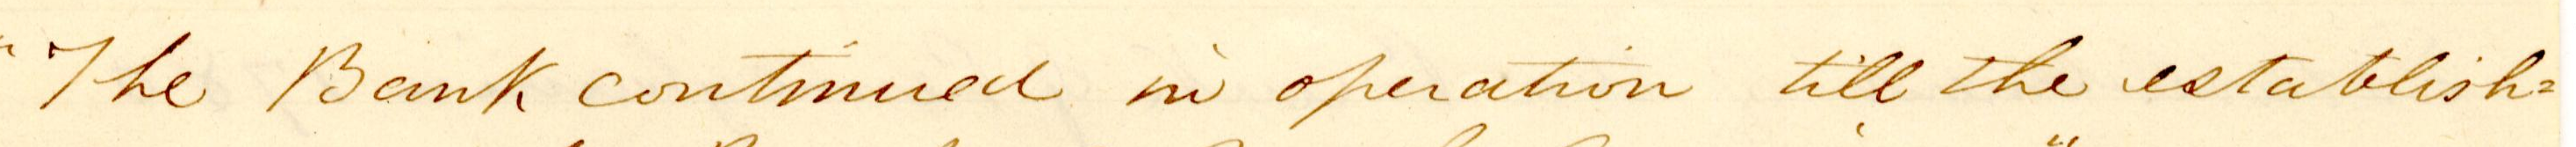The Bank continued in operation till the establish-
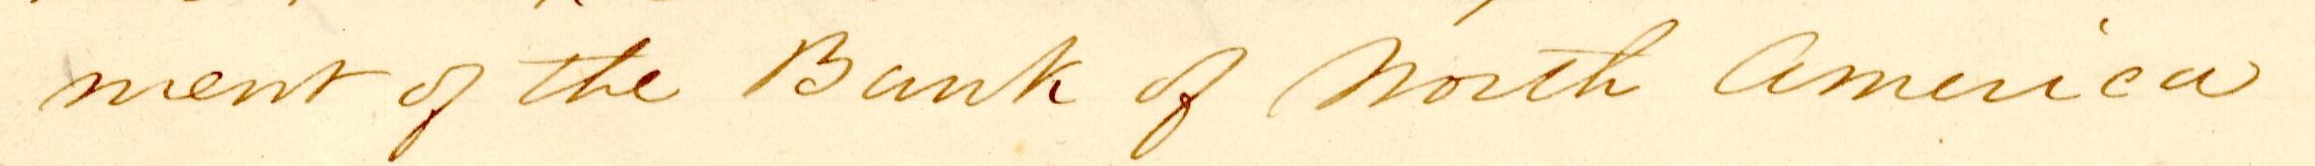ment of the Bank of North America
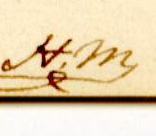H.M
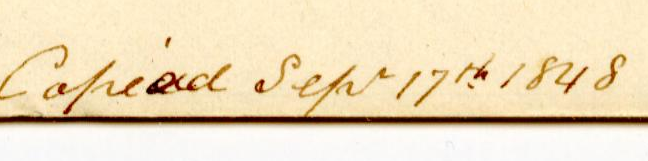Copied Sep^r 17^th 1848
